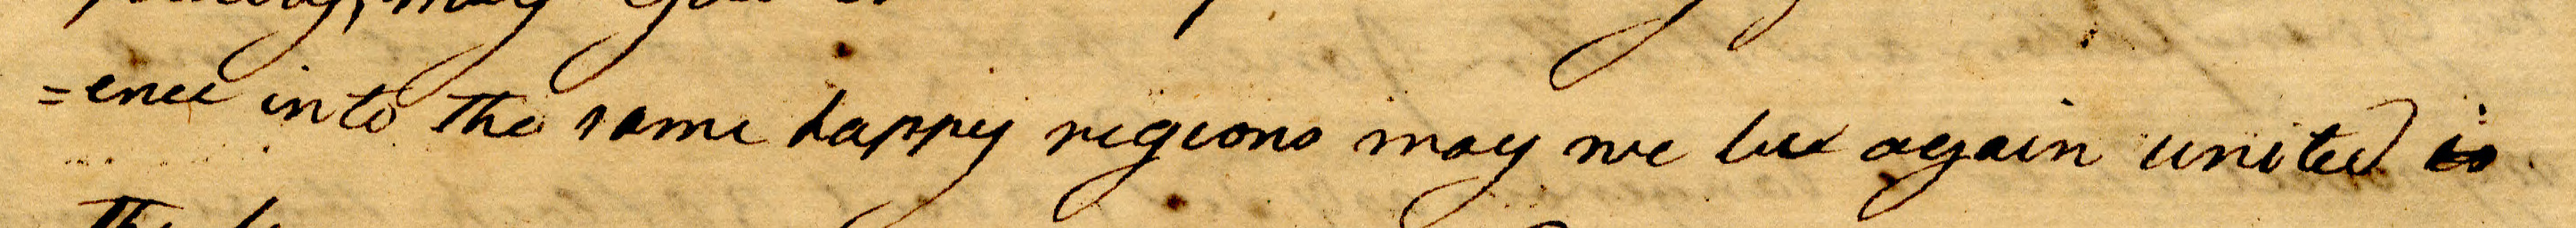-ence into the same happy regions may we be again united [is]
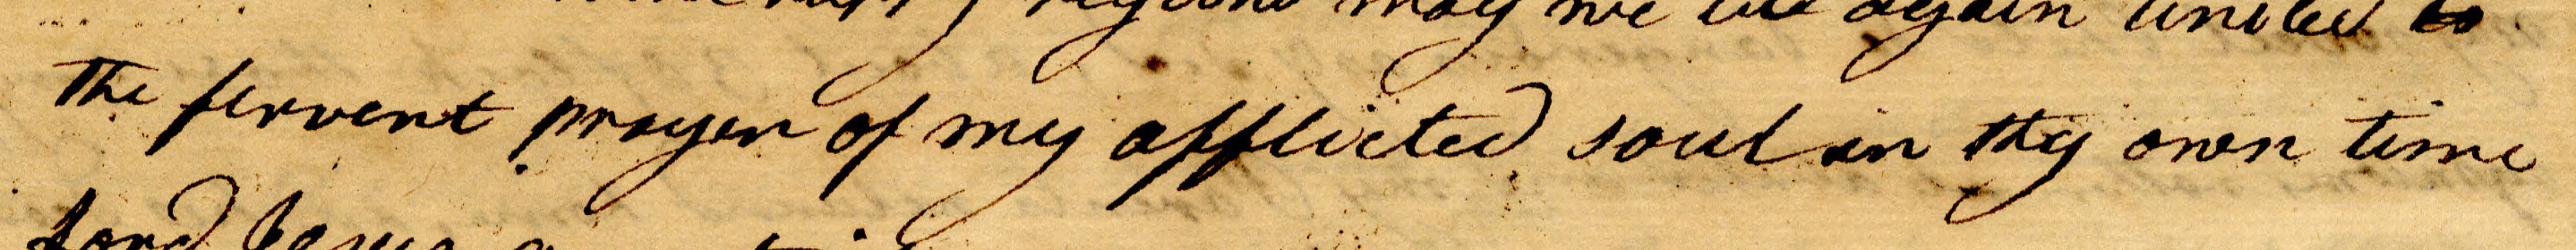the fervent prayer of my afflicted soul in thy own time
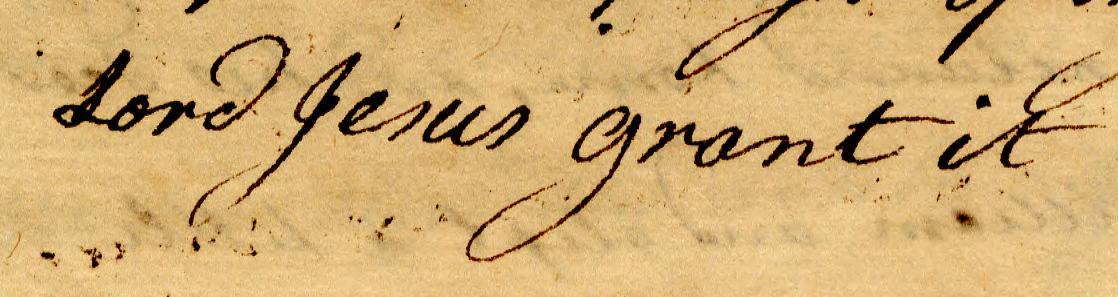Lord Jesus grant it
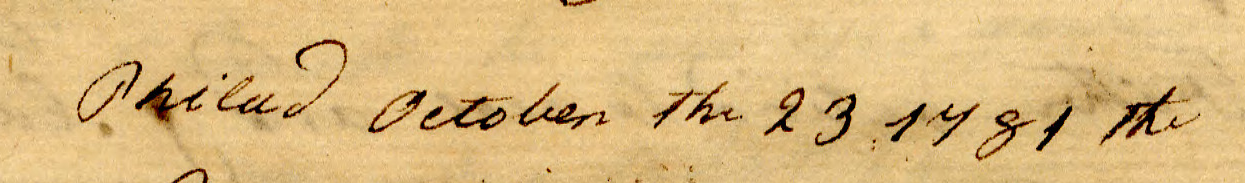Philad October the 23 1781 the
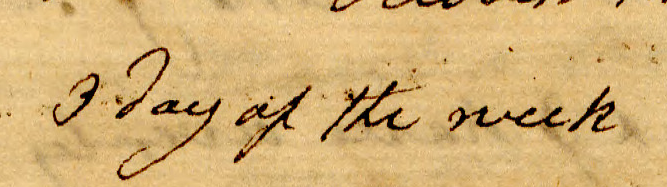3 day of the week
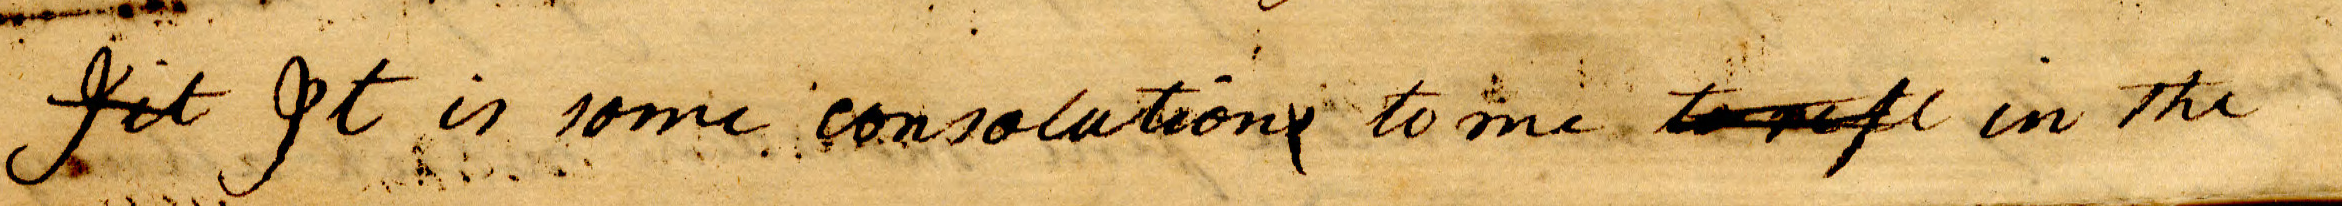It is some consolution to me [to refl] in the
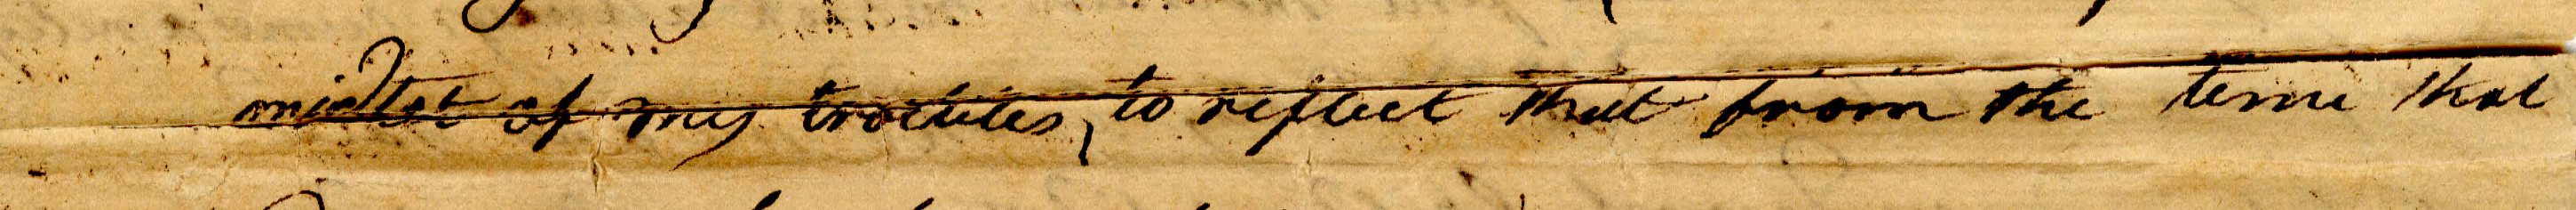midst of my troubles, to reflect that from the time that
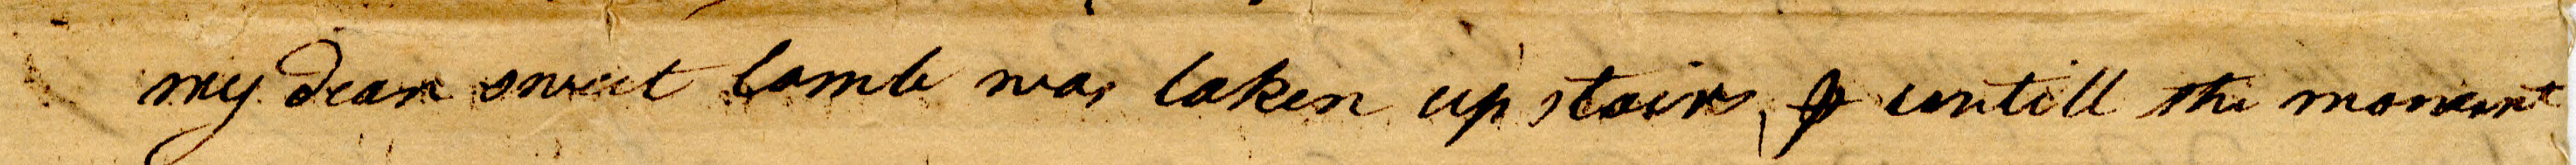my dear sweet lamb was taken up stairs & untill the moment
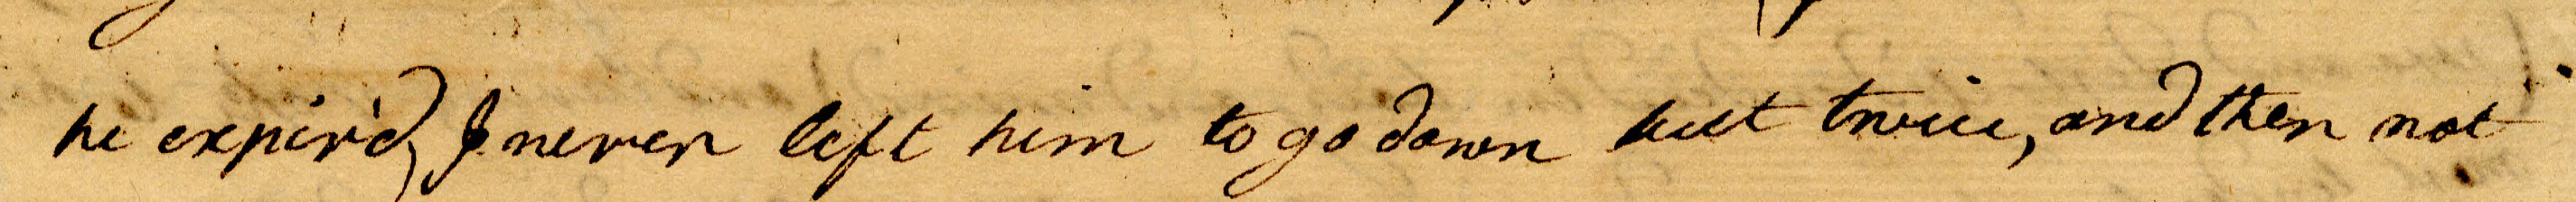he expir'd, I never left him to go down but twice, and then not
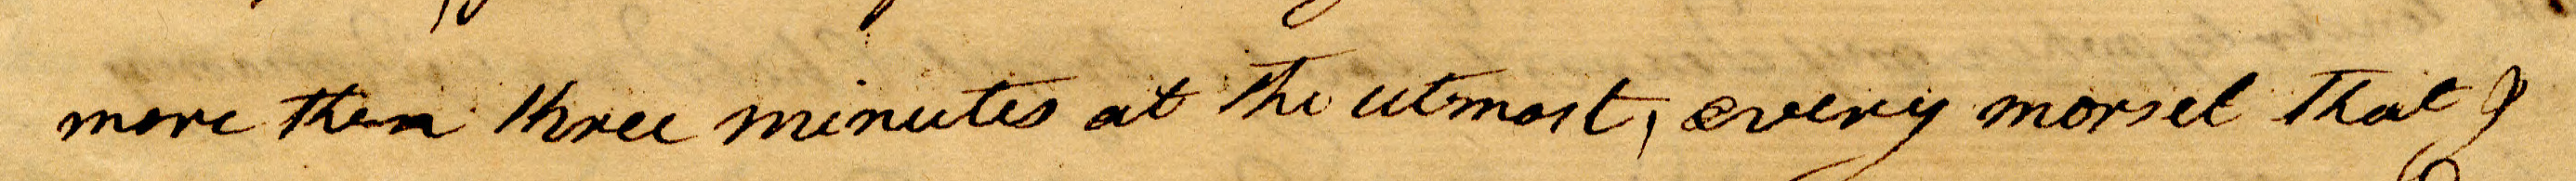more than three minutes at the utmost, every morsel that I
